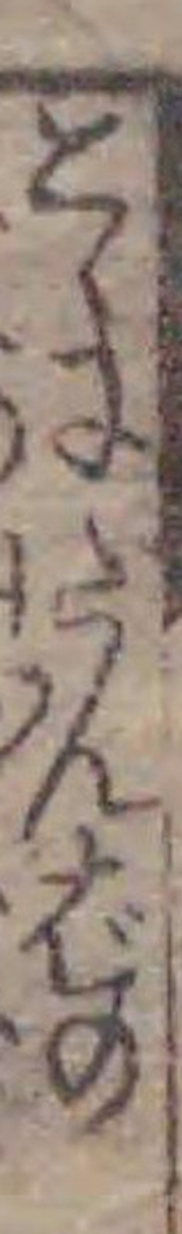こゝにたんばの
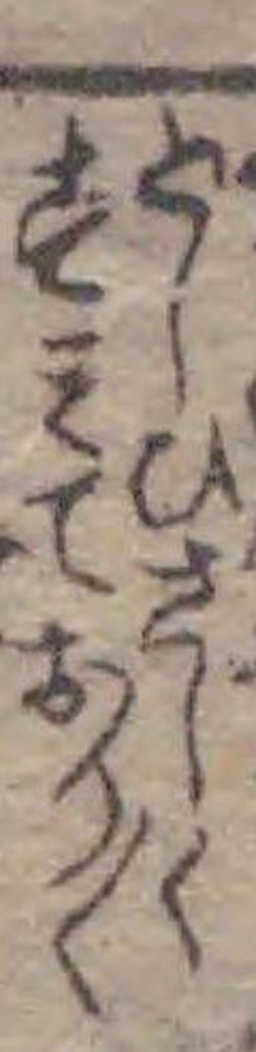すみており〳〵
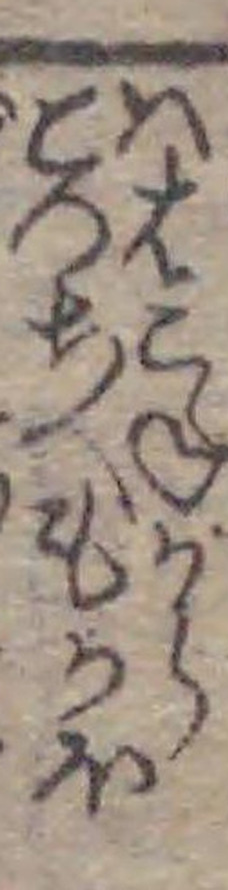こつちへもかほ
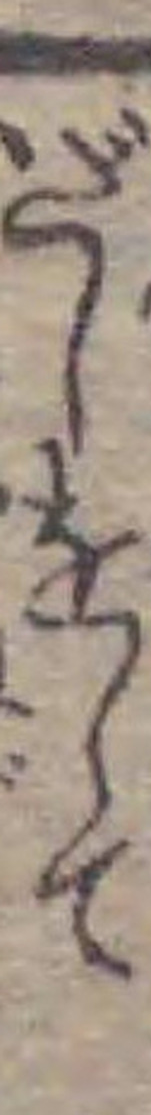だしをして
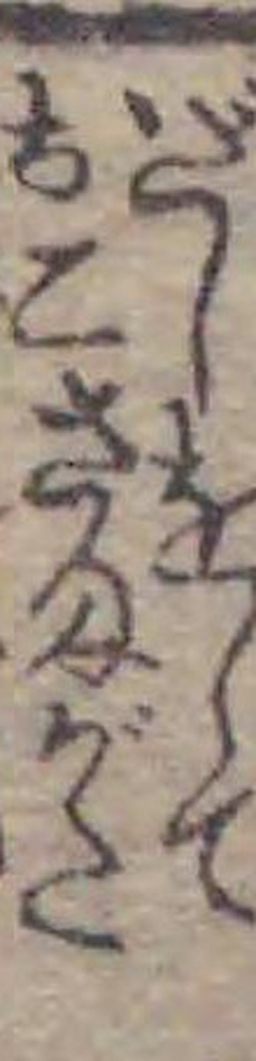おこさまがた
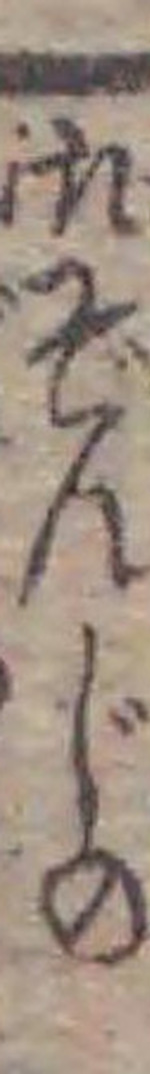御ぞんじの
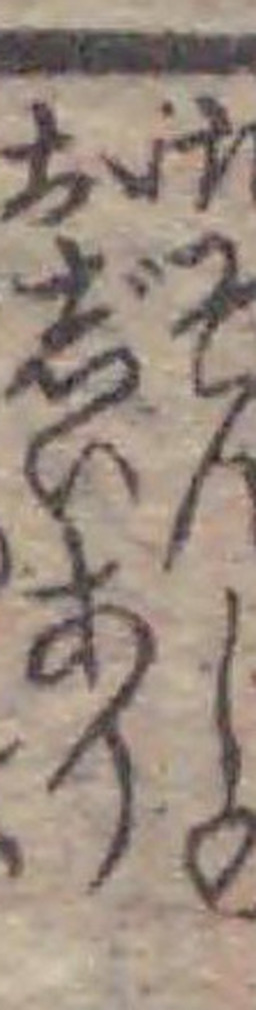おじいあり
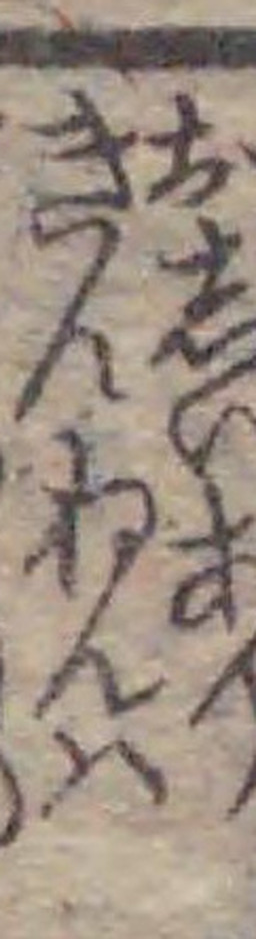きんねんは
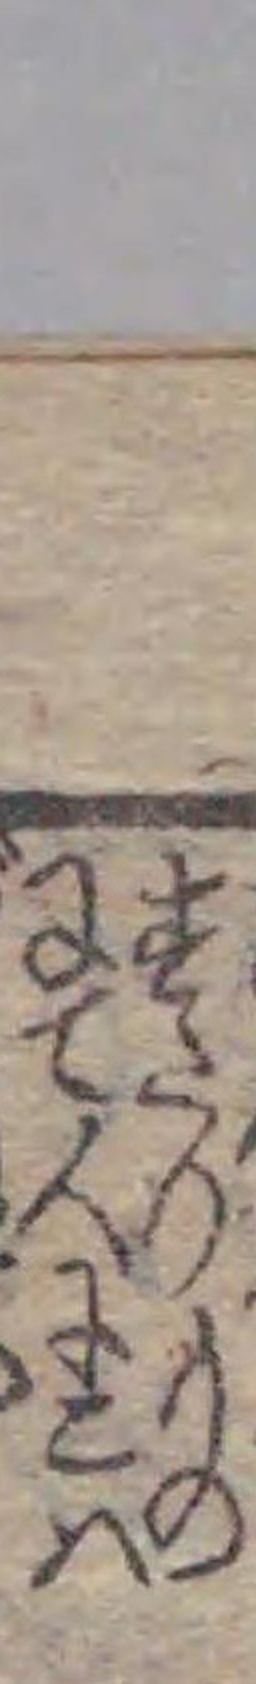にて人にこは
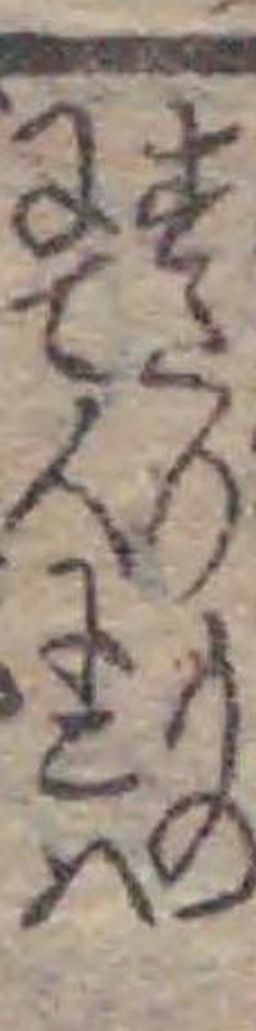にて人にこは
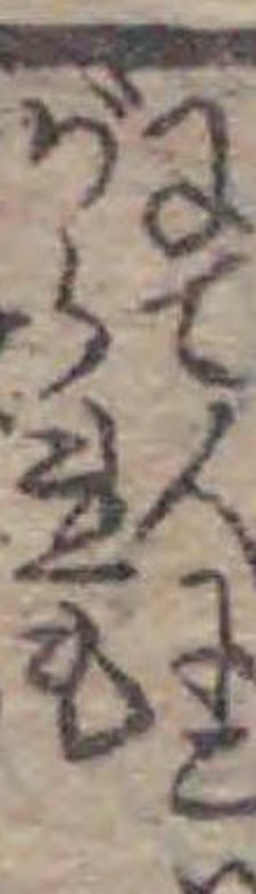がられも
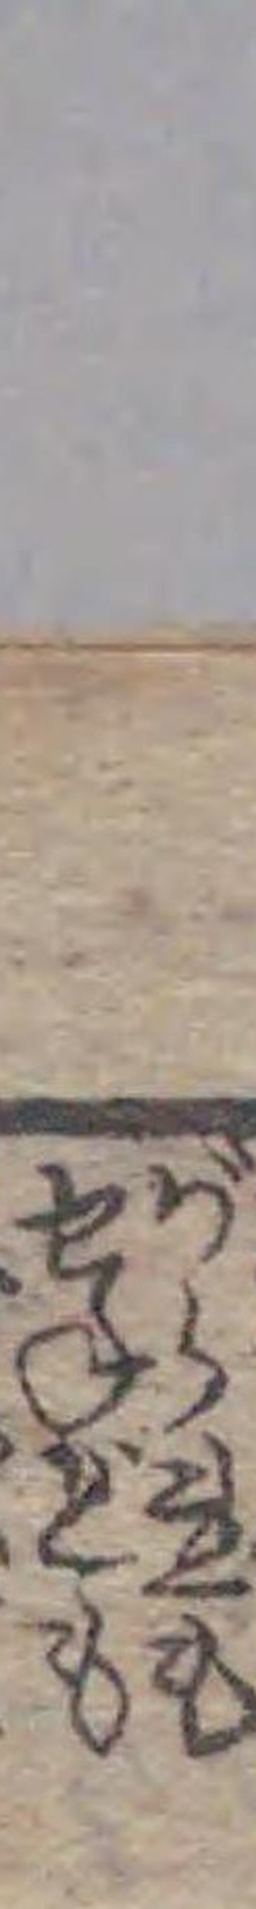せねども
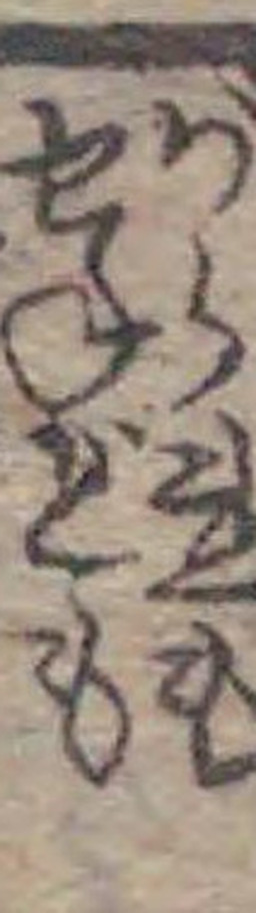せねども
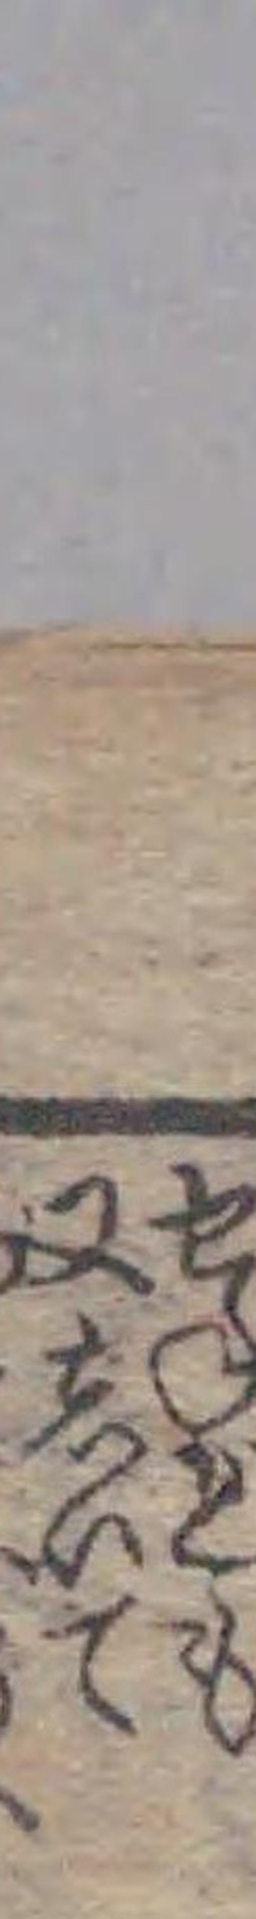又しいて
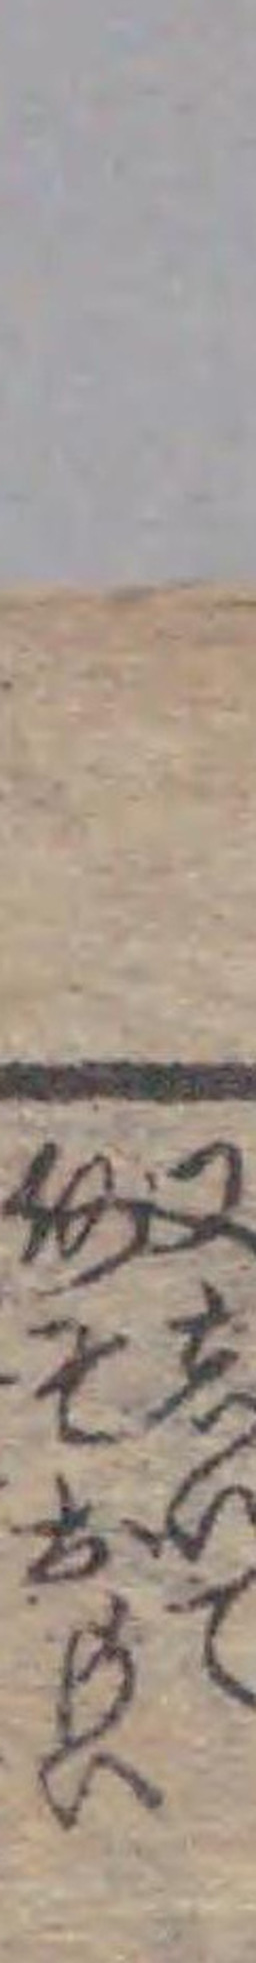何そおもい
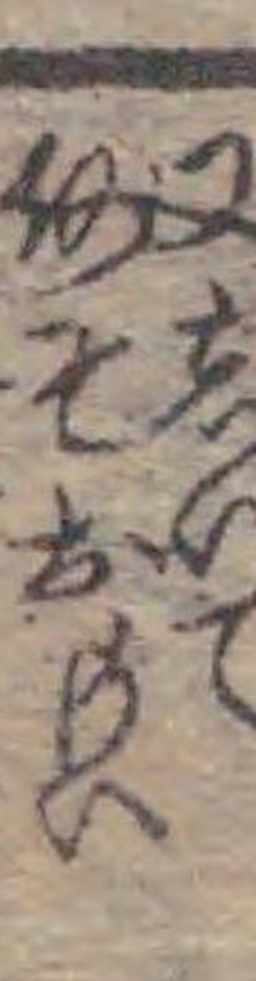何そおもい
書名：化物見越松 : 2巻
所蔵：国立国会図書館 National Diet Library, JAPAN
